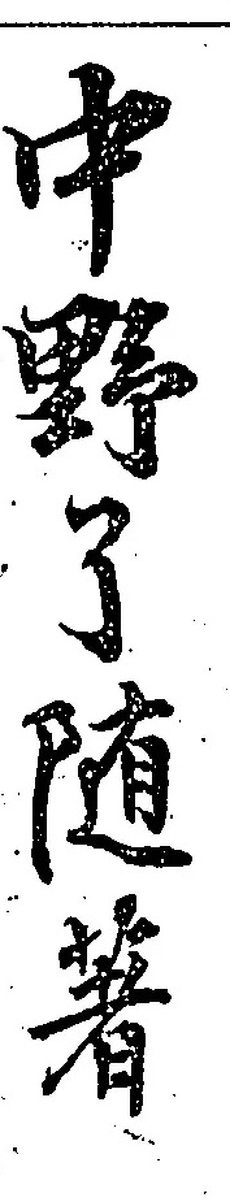中野了随著
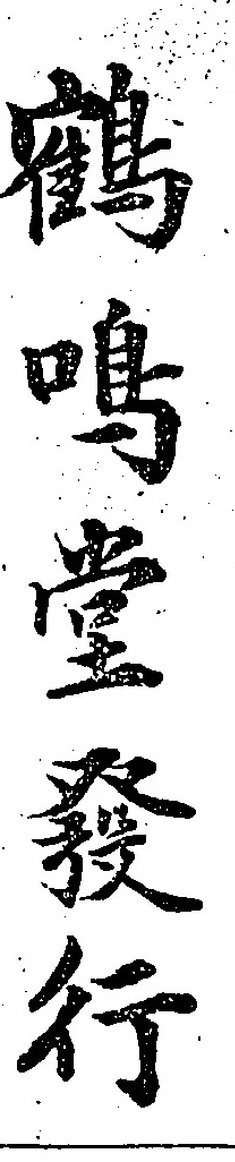鶴鳴堂發行

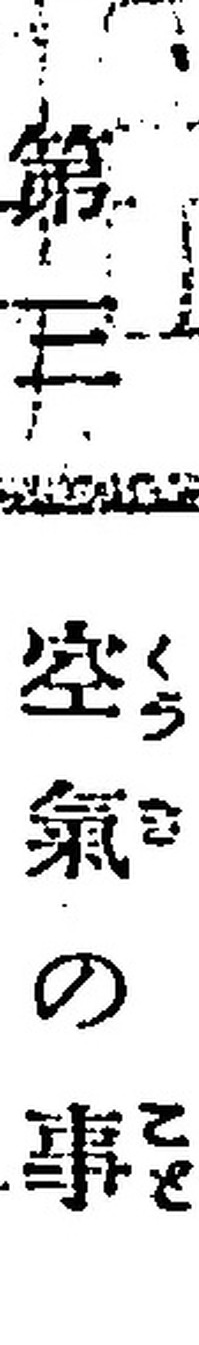第三空気の事
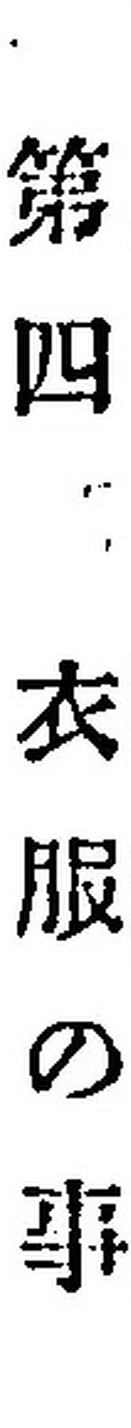第四衣服の事
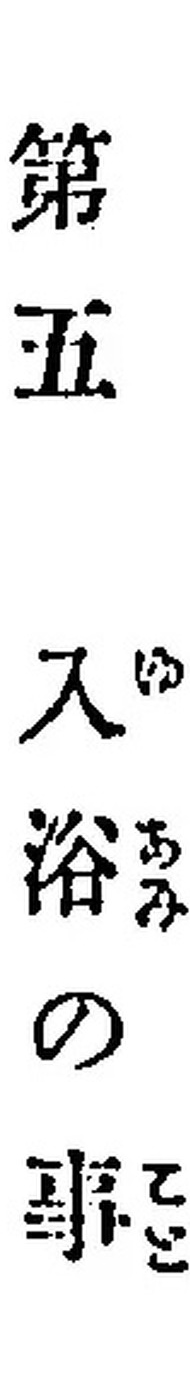第五入浴の事
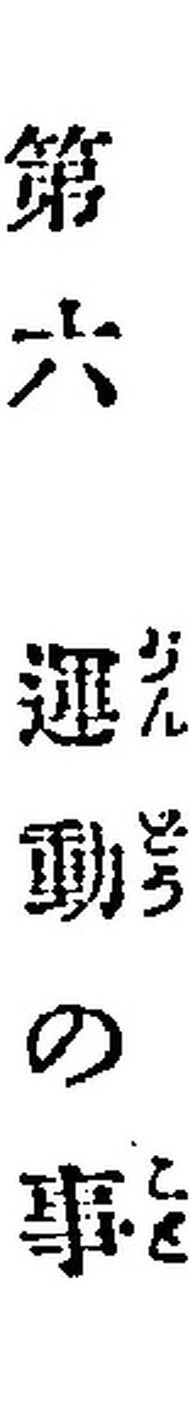第六運動の事
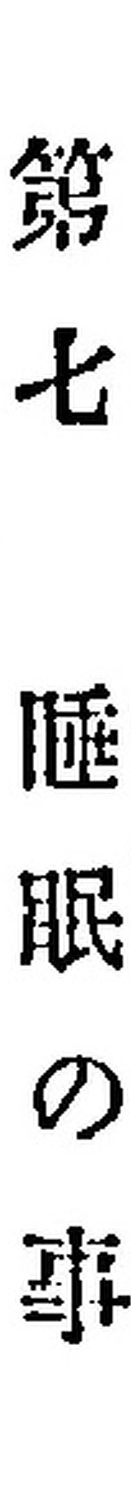第七睡眠の事
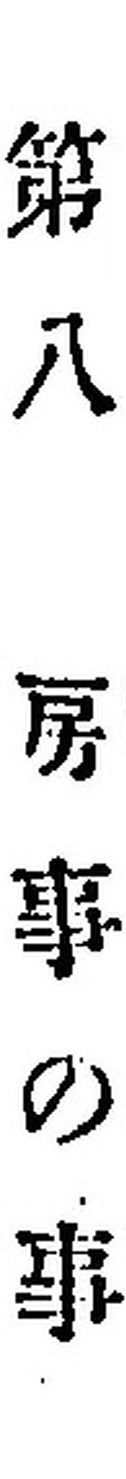第八房時の事

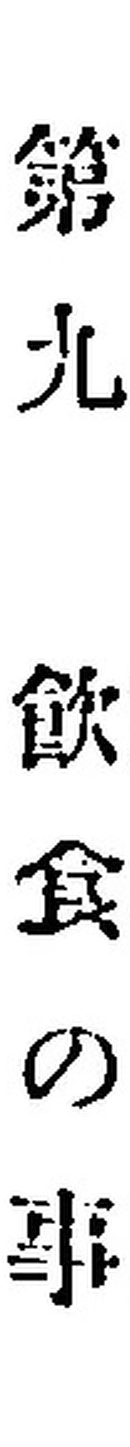第九飲食の事
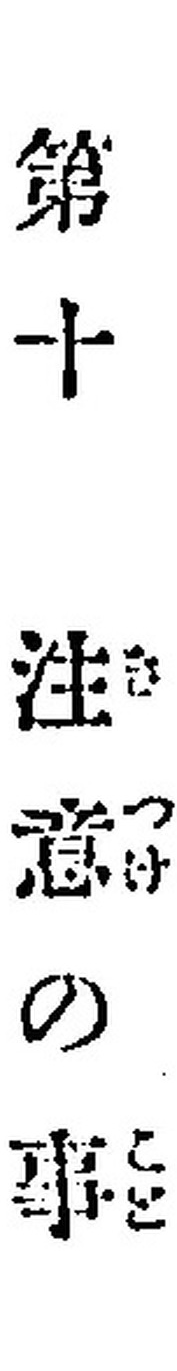第十注意の事
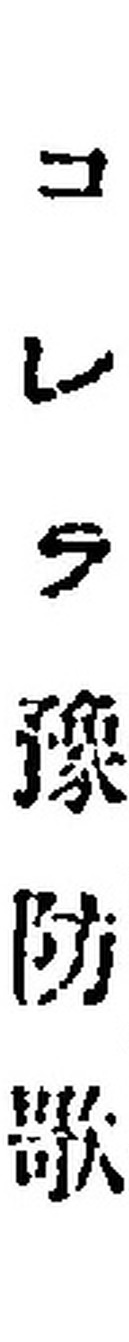コレラ豫防歌
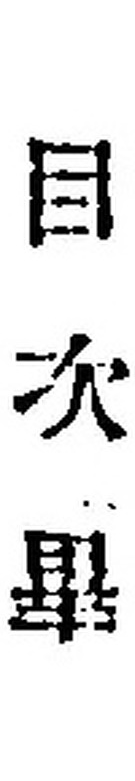目次畢
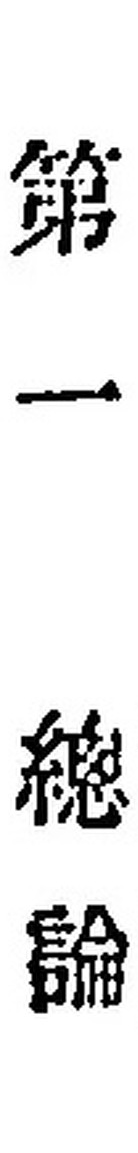第一総論
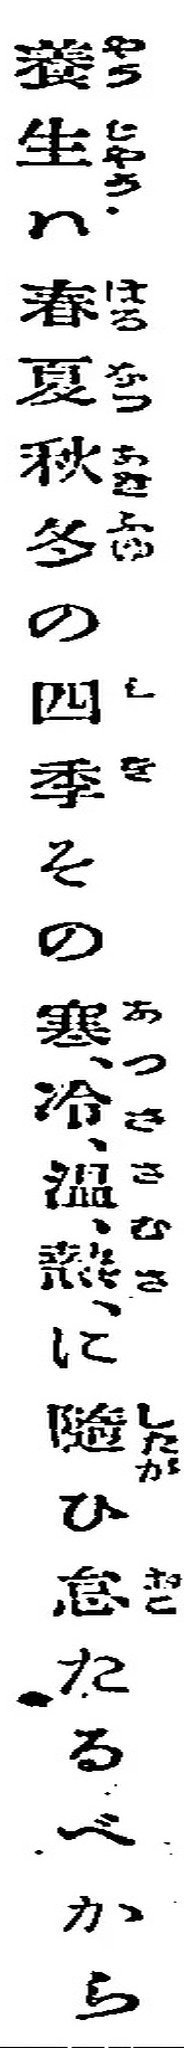養生は春夏秋冬の四季その寒、冷、温、熱に随ひ怠たるべから
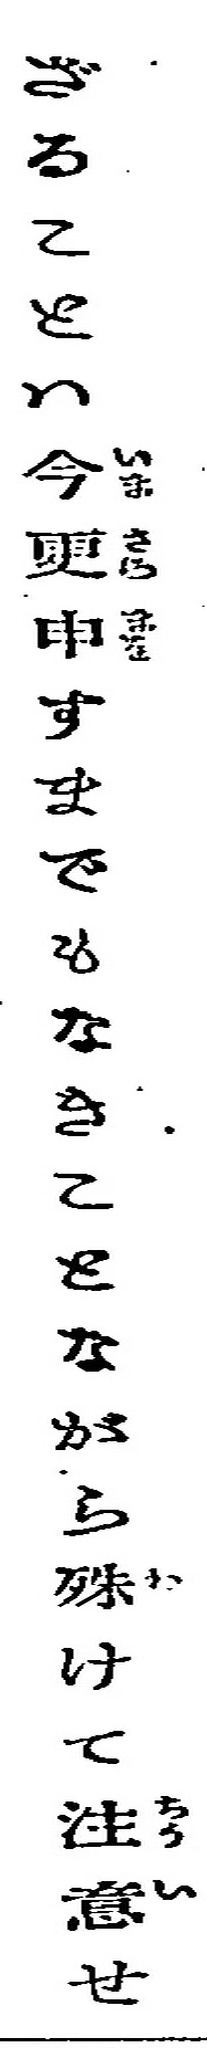ざることは今更申すまでもなきことながら殊けて注意せ
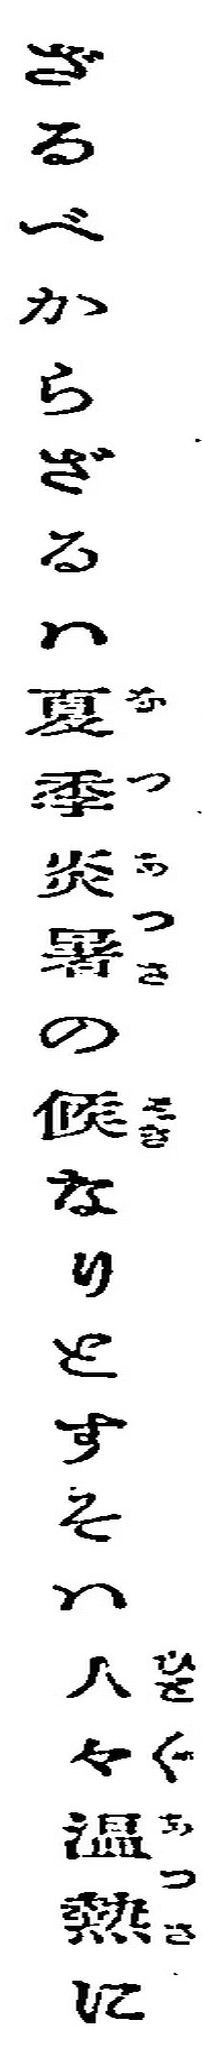ざるべからざるは夏季炎暑の候なりとすは人々温熱に
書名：新撰暑中養生法 : 附・コレラ予防歌
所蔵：国立国会図書館 National Diet Library, JAPAN
